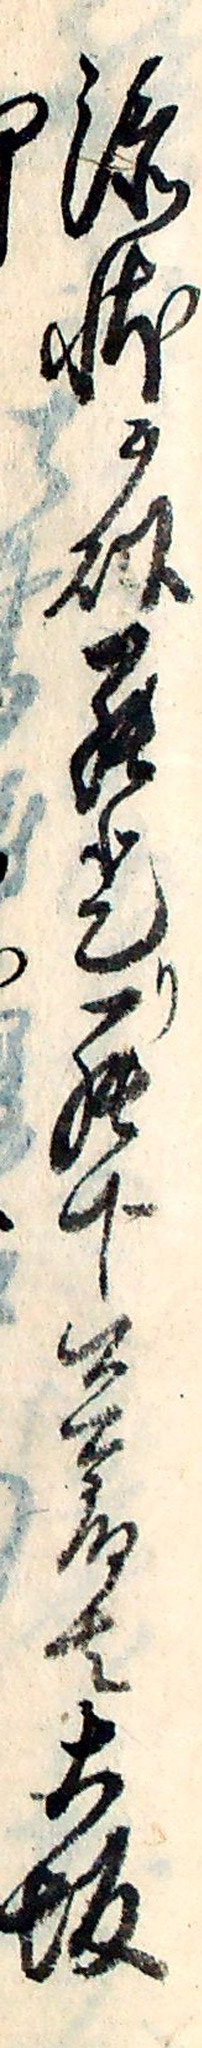添状を以罷登り罷下候節は大坂
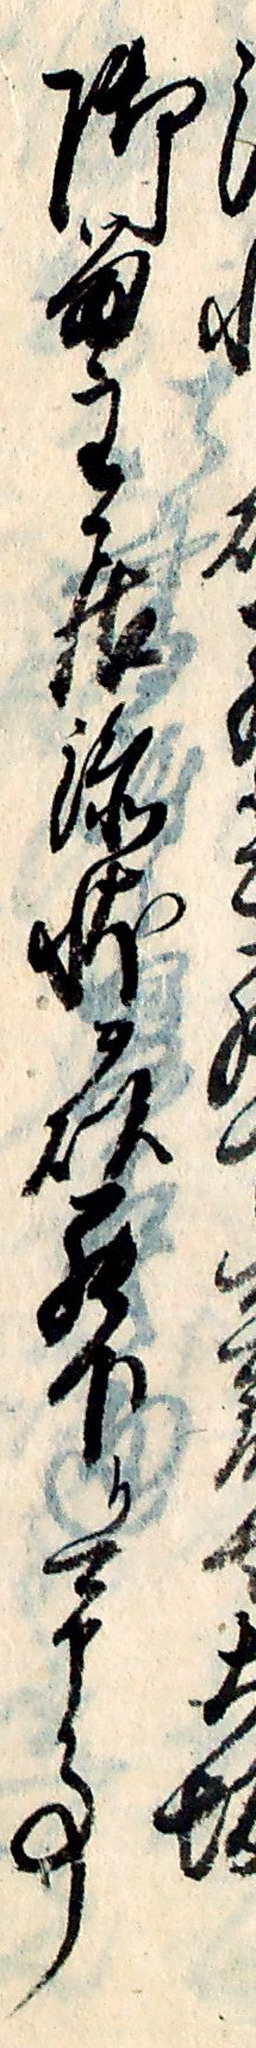御留主居添状を以罷下り可申事
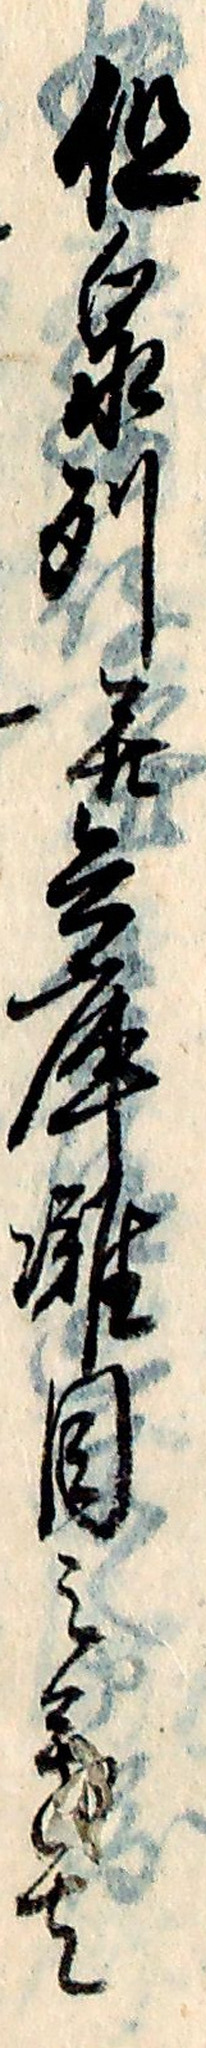但泉州并兵庫灘目之義は
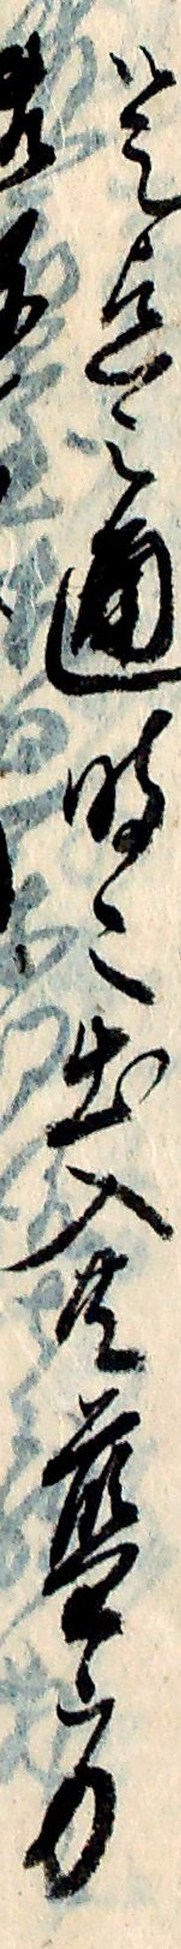是迄之通時々出入共藍方
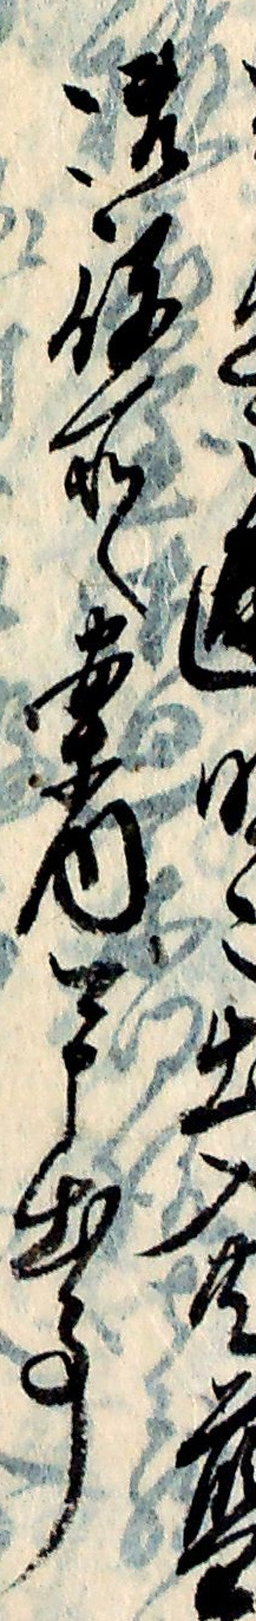御役所へ案内可申出事
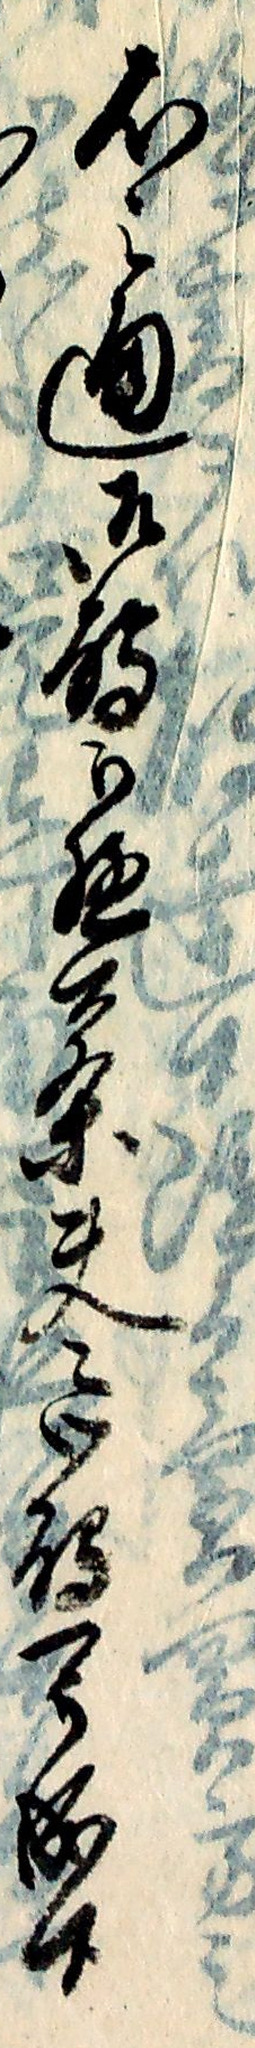右之通御触被遊候条夫々御触可被成候
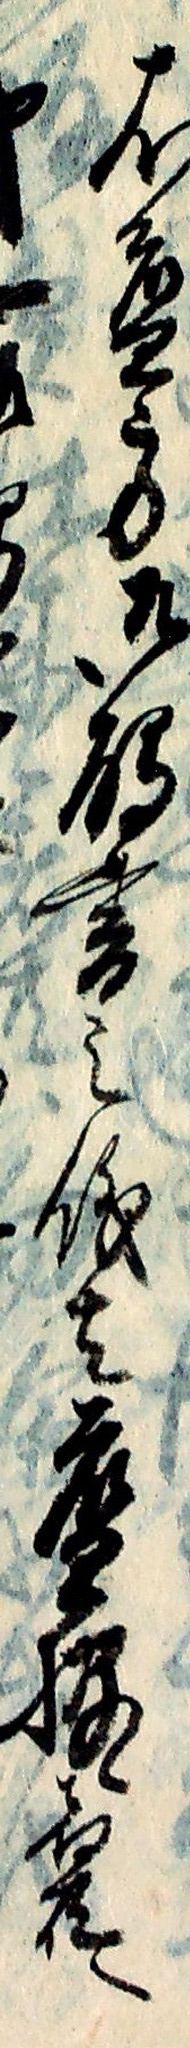右藍方御触書之儀は藍扱候者共へ
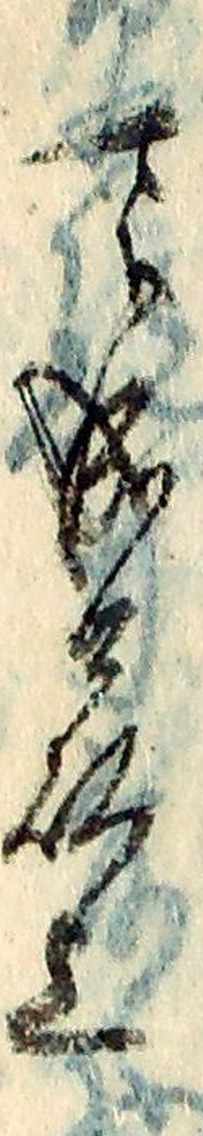可被成候以上
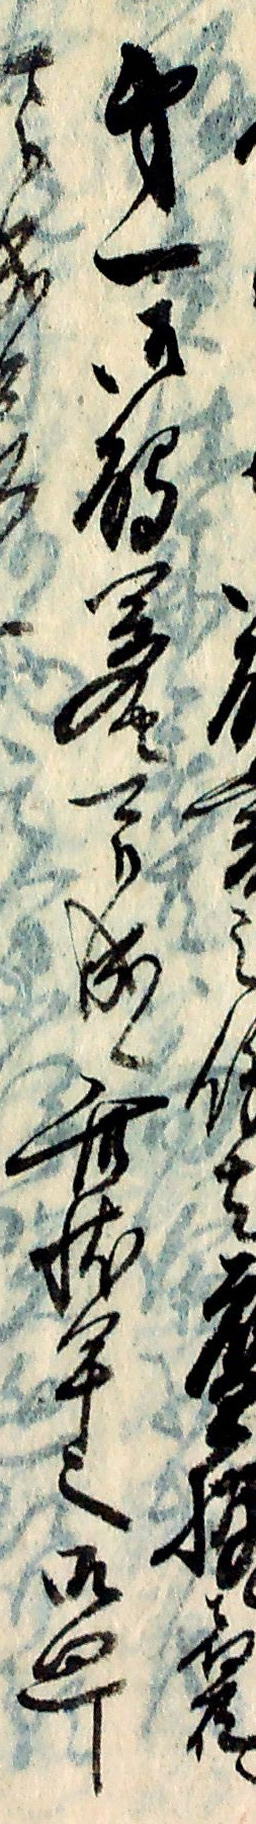第一御触聞せ可被成候此状早々御廻し
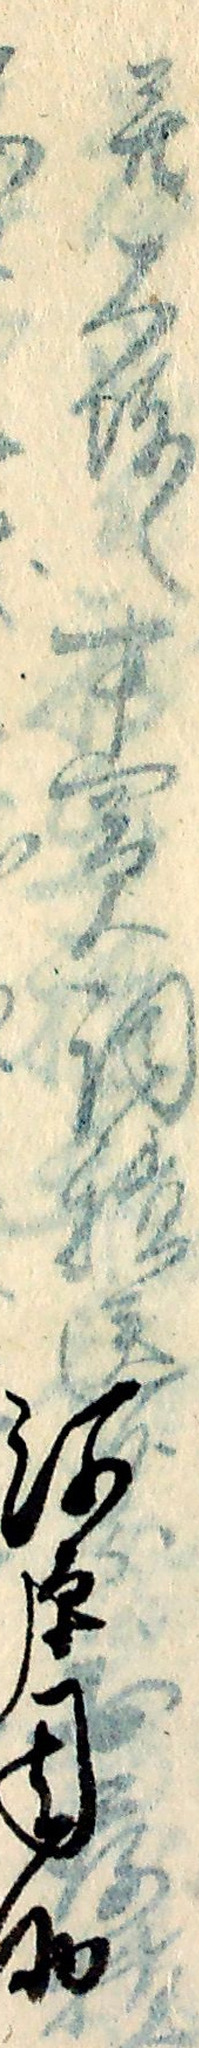河原周助
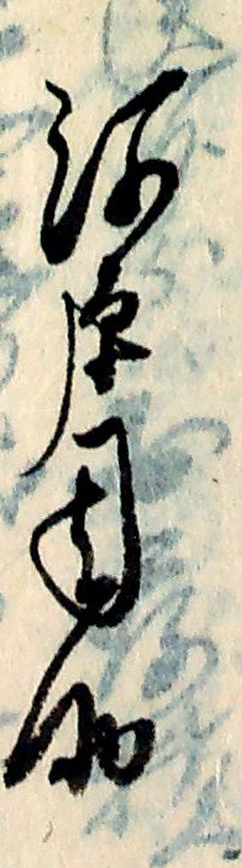河原周助
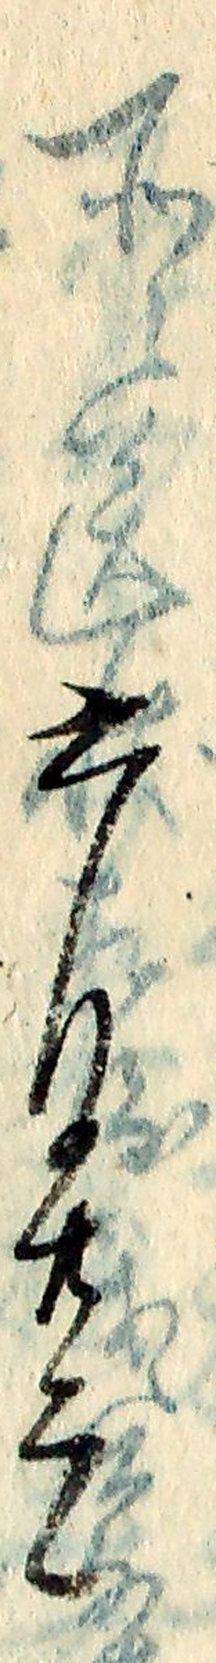六月廿二日
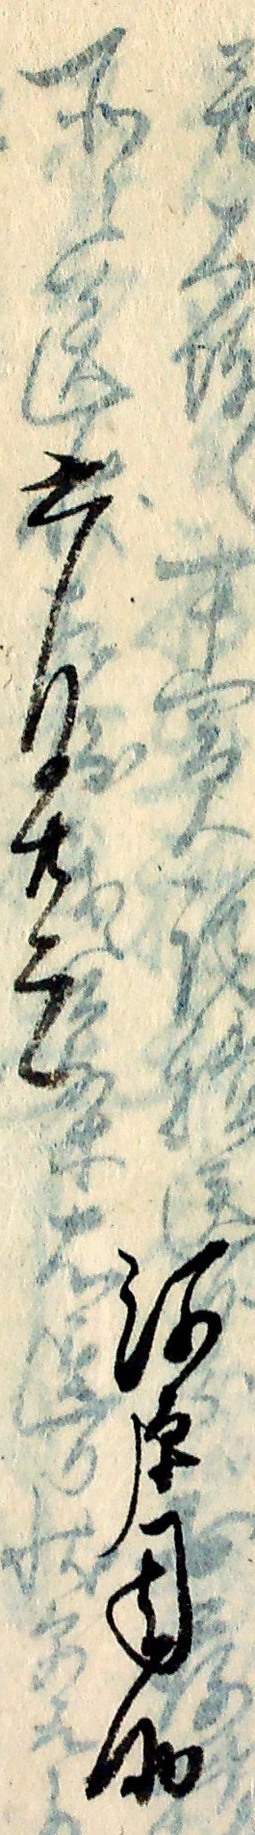六月廿二日
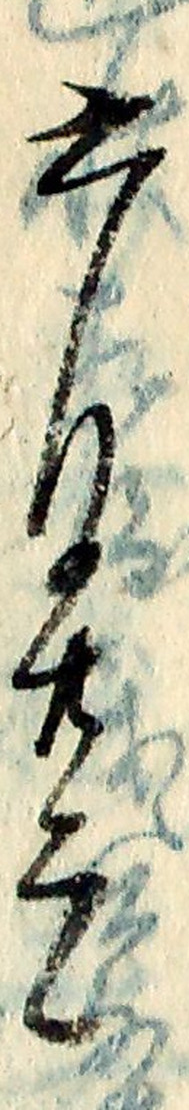六月廿二日

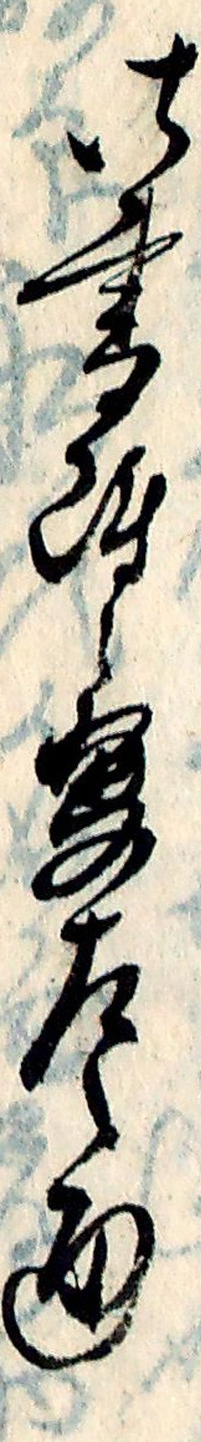御書附之写左之通
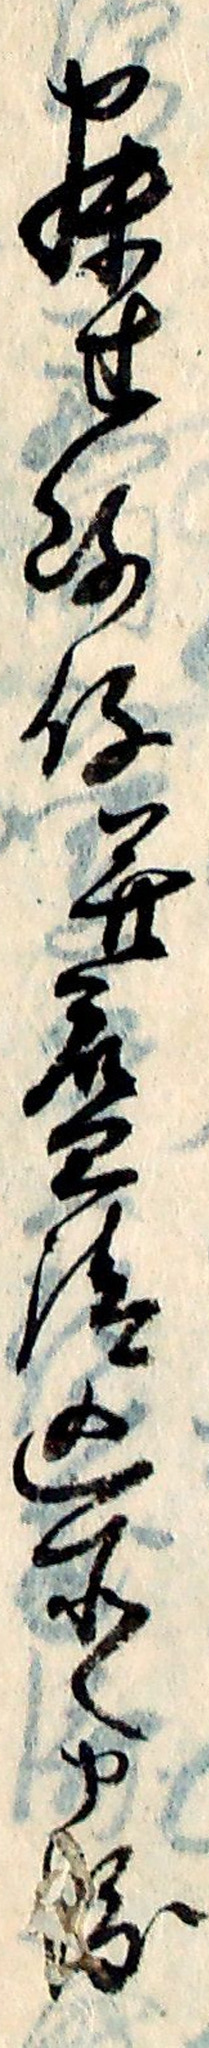寐せ改役并藍積込所へ申渡
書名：諸御願書控(後藤氏壱番）
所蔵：鳴門教育大学 Naruto University of Education
